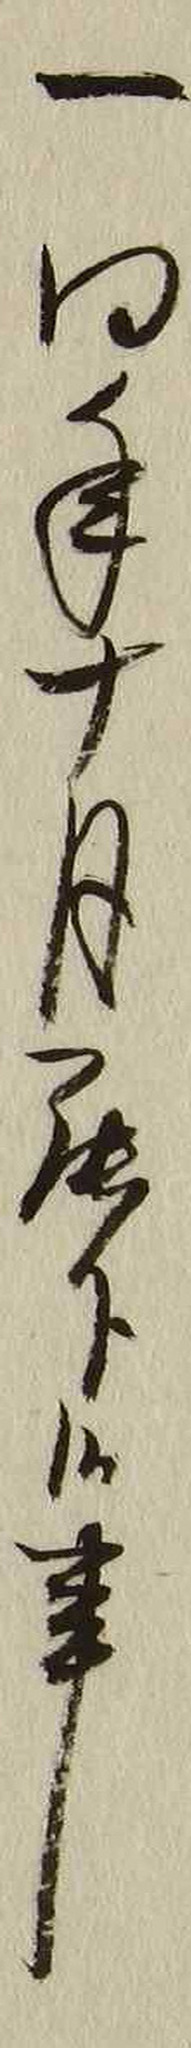一同年十月罷下候事
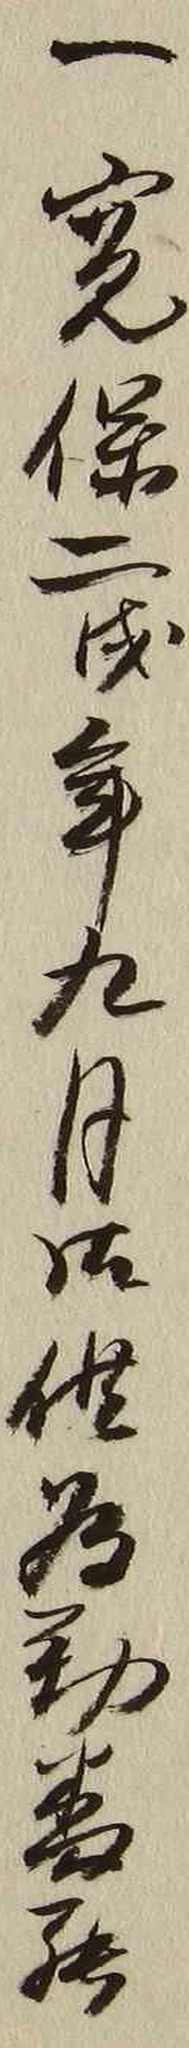一寛保二戌年九月御供為勤番罷
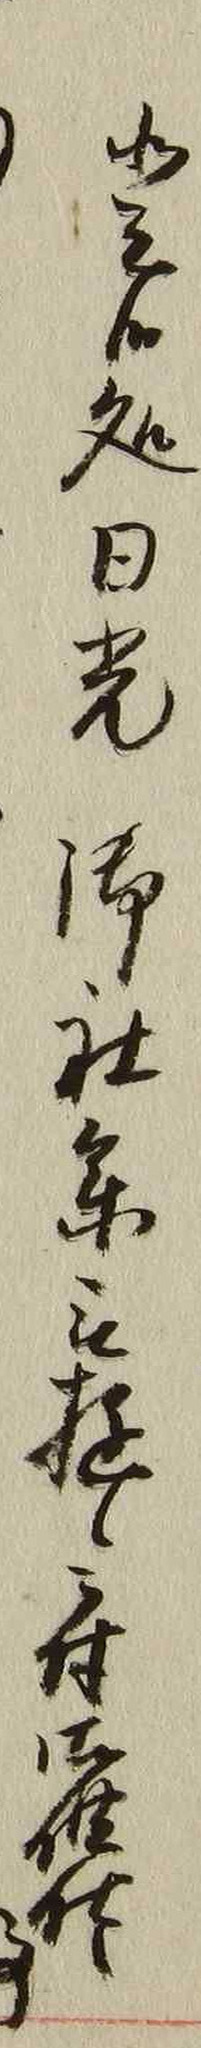登候処日光御社参被遊候ニ付御供仕候事
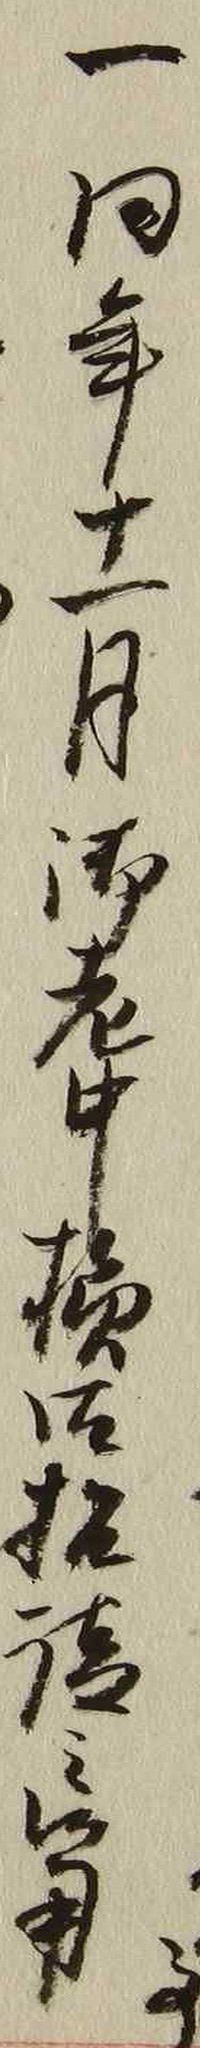一同年十一月御老中様御招請之御用
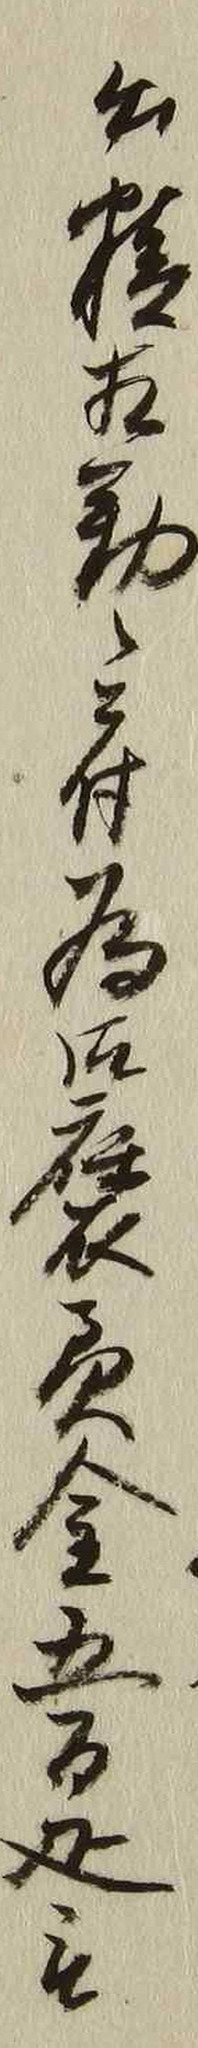出精相勤候ニ付為御褒美金五百疋被
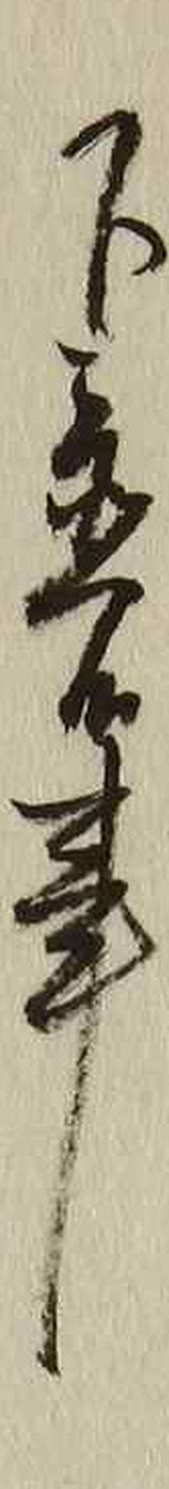下置候事
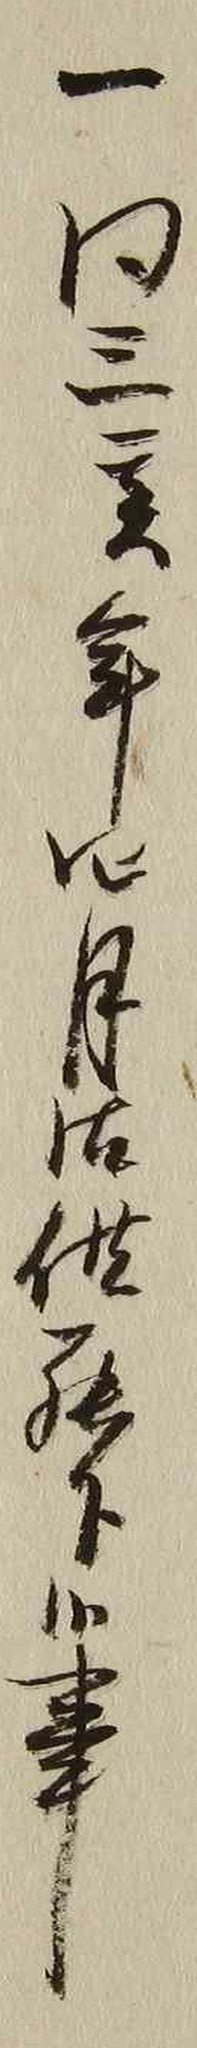一同三亥年四月御供罷下候事
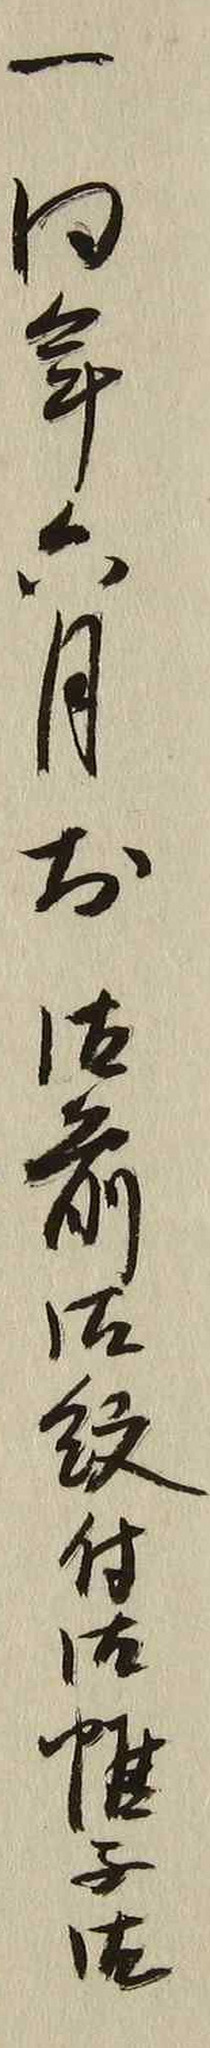一同年六月於御前御紋付御帷子御
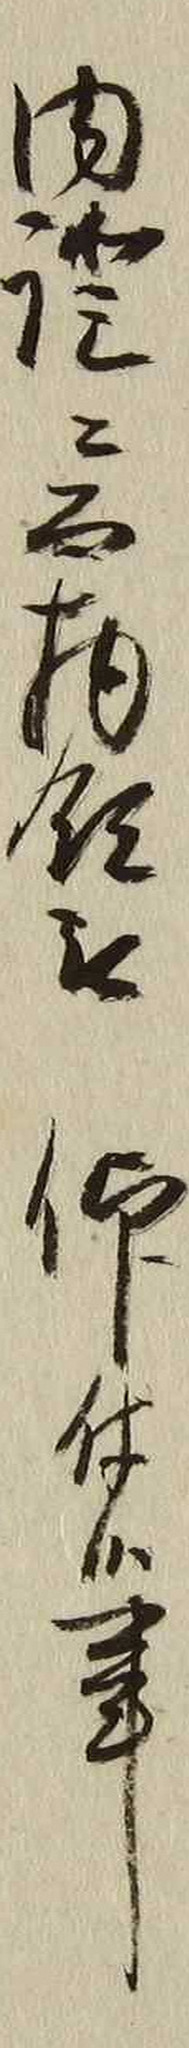内証ニ而拝領被仰付候事
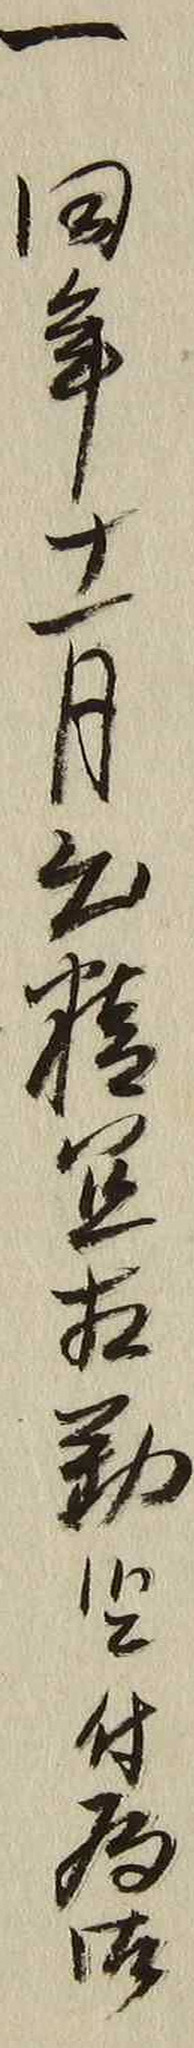一同年十一月出精宜相勤候ニ付為御
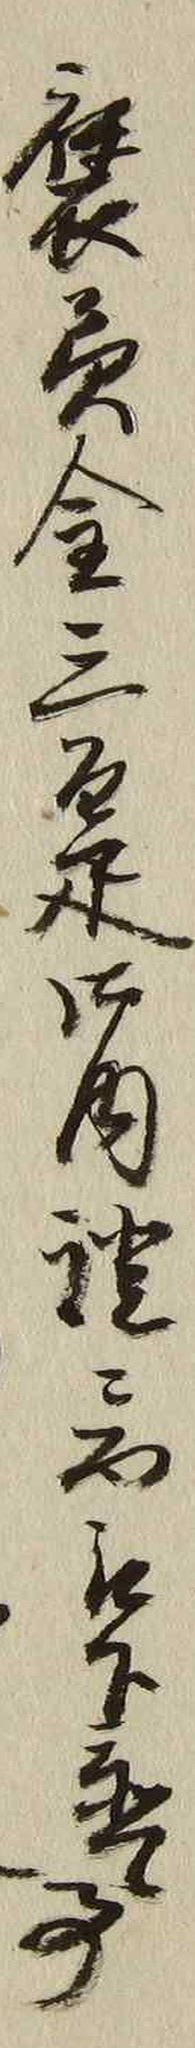褒美金三百疋御内証ニ而被下置候事
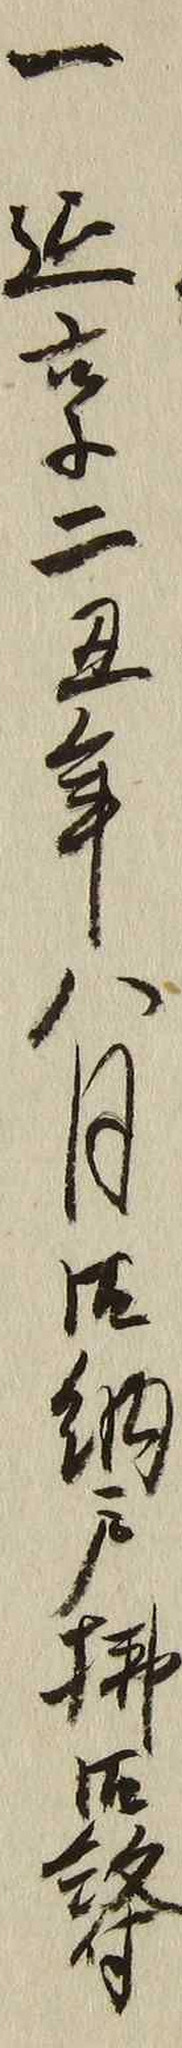一延享二丑年八月御納戸払御紋付
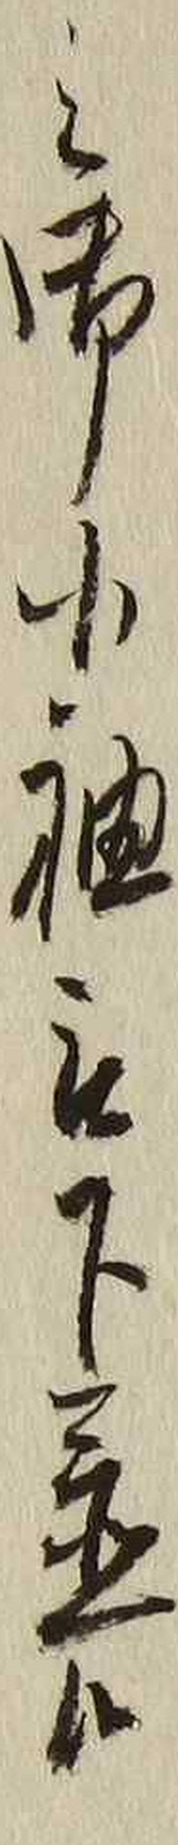之御小袖被下置候
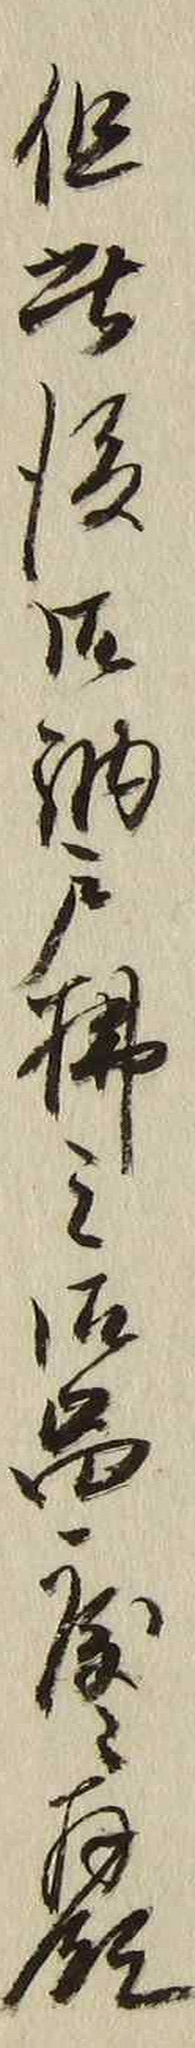但此後御納戸払之御品度々拝領
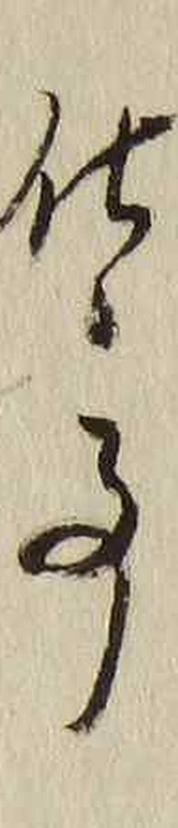仕候事
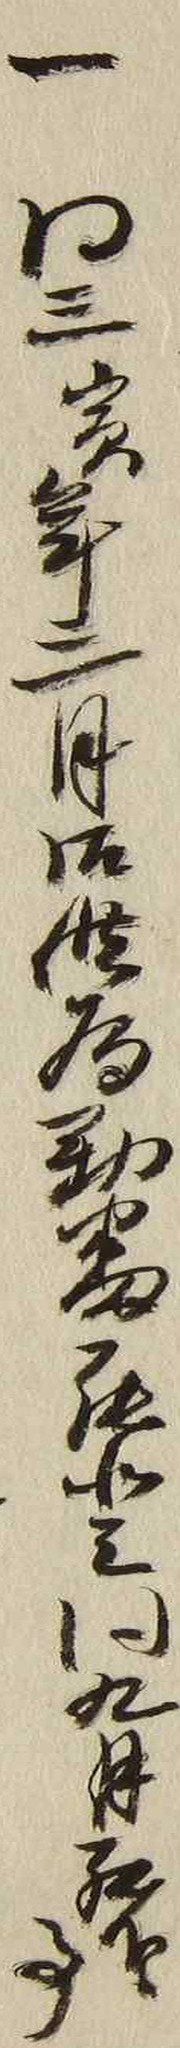一同三寅年二月御供為勤番罷登同九月罷下候事
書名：諸士系譜　巻之349　も之部5
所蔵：会津若松市立会津図書館
